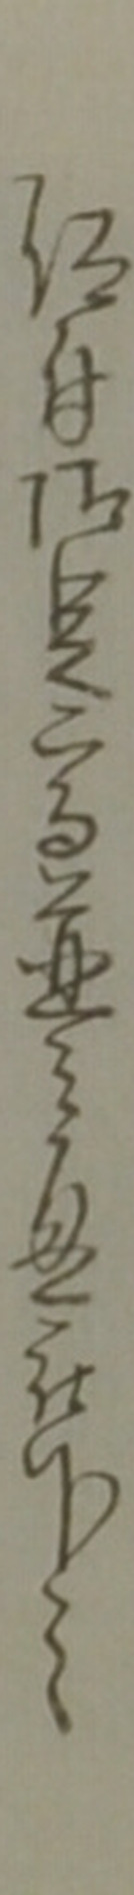仰付御足高並之通被下之
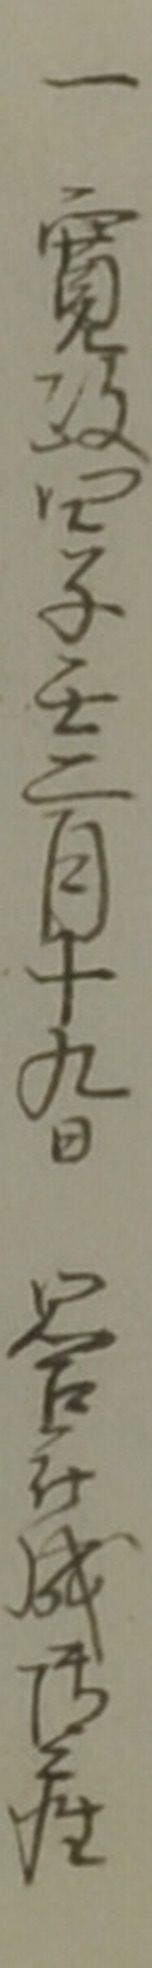一寛政四子閏二月十九日思召被成御座
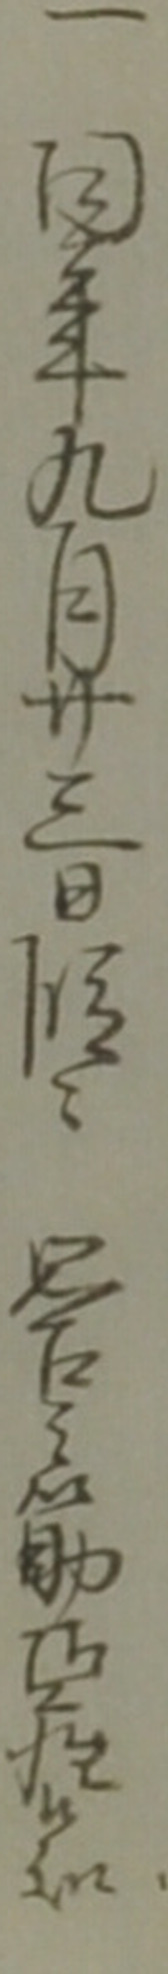一同年九月廿三日段々思召之筋御座候処
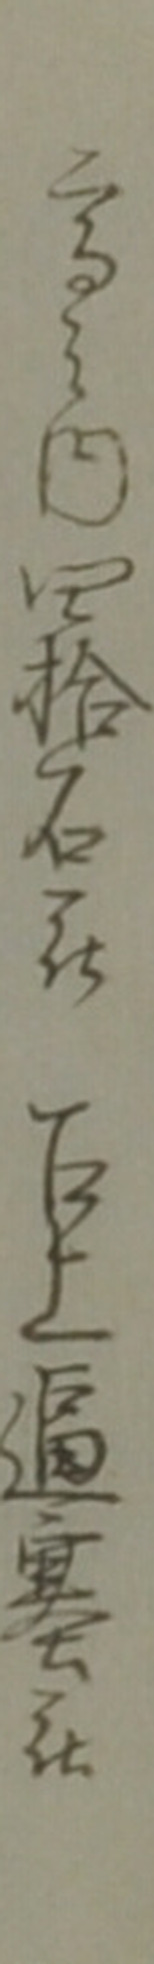高之内四拾石被召上逼塞被
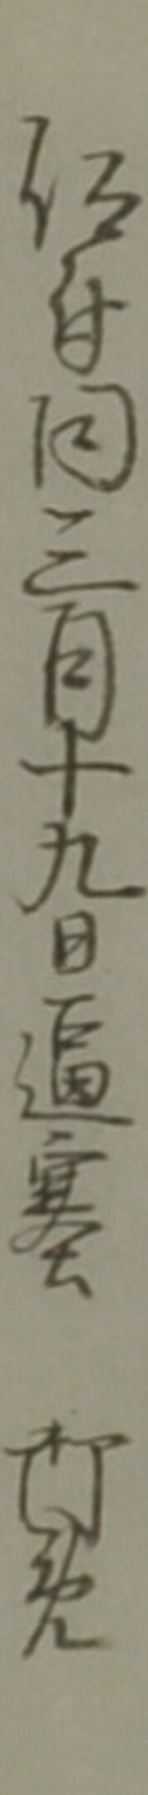仰付同三月十九日逼塞御免
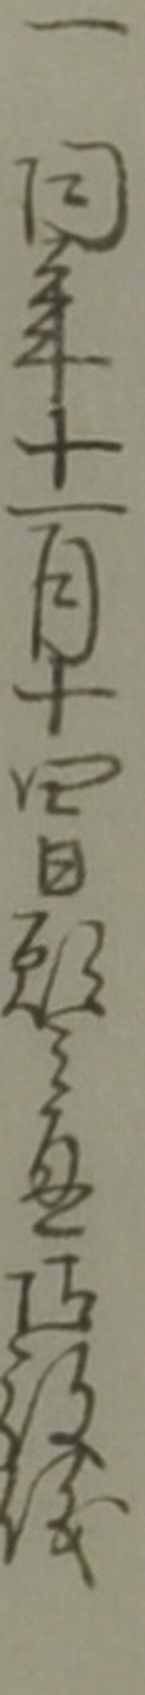一同年十一月十四日願之通御役儀
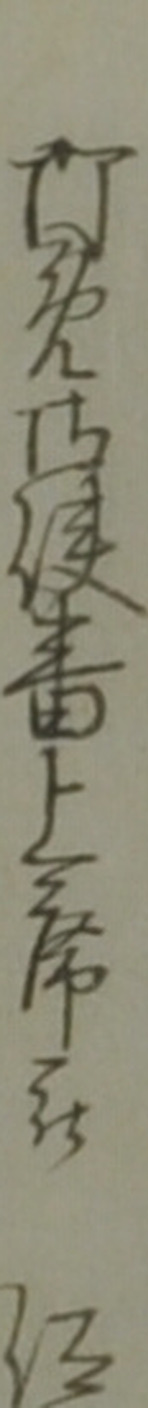御免御使番上席被仰付
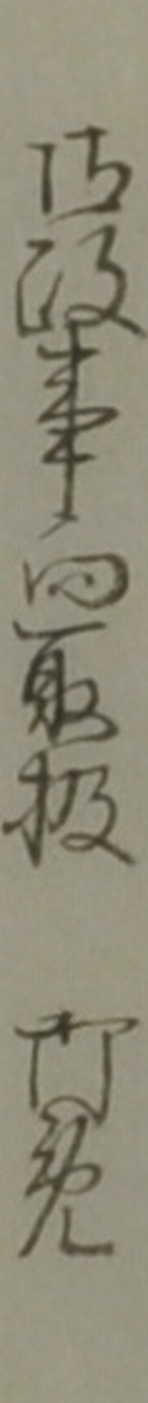御政事向取扱御免
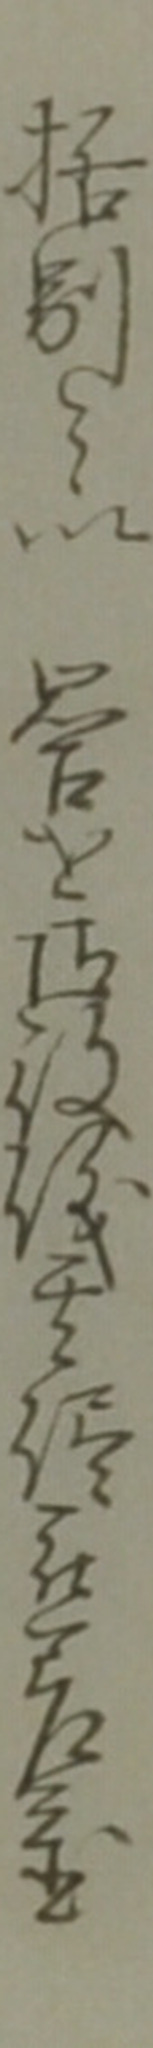格別之以思召を御役儀其侭被差置

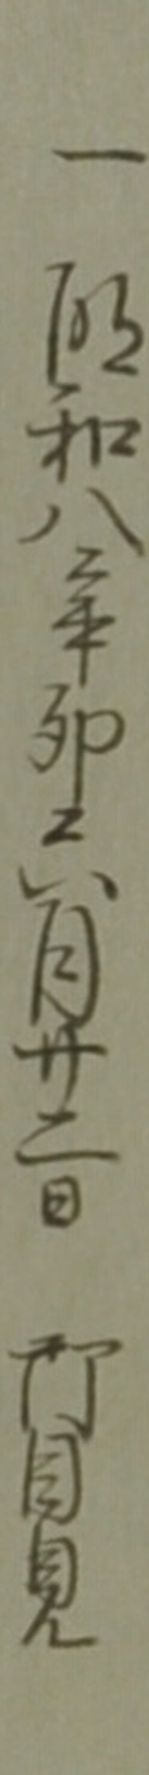一明和八辛卯六月廿ニ日御目見
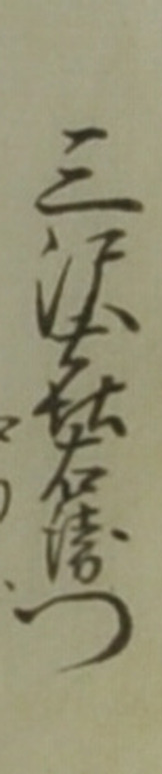三沢喜右衛門
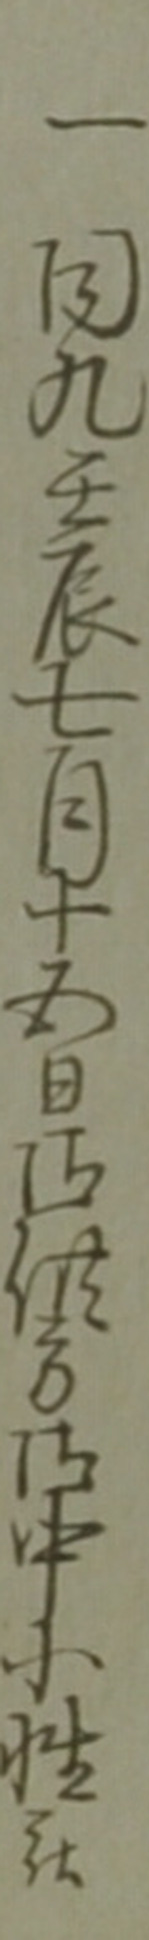一同九壬辰七月十五日御供方御中小性被
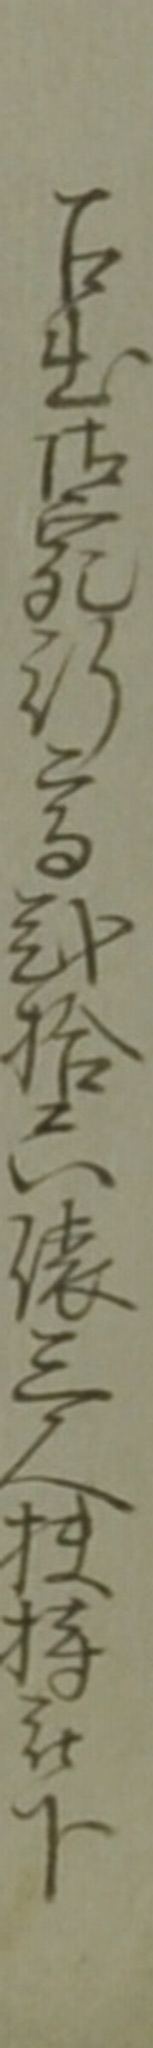召出御宛行高弐拾六俵三人扶持被下
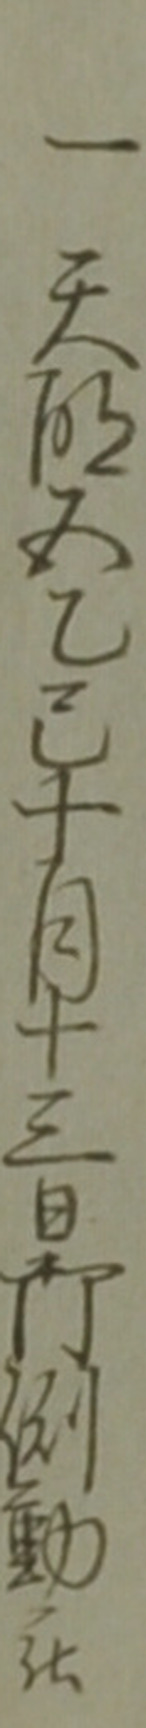一天明五乙巳十月十三日御側勤被
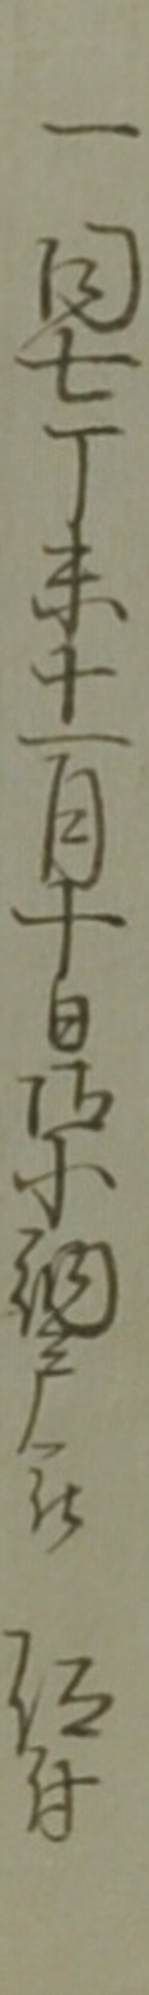一同七丁未十一月十日御小納戸被仰付
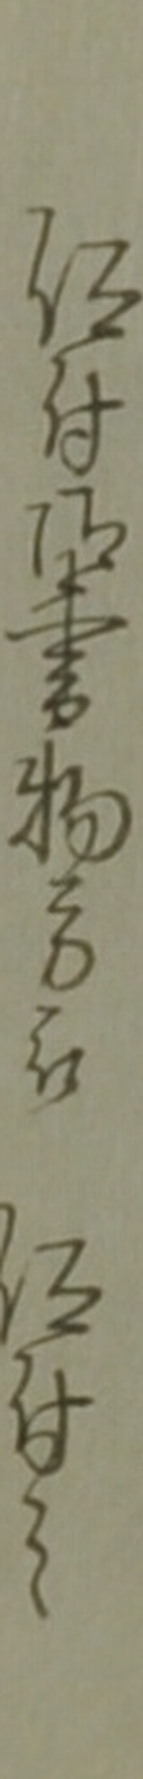仰付御書物方被仰付之
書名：給人諸士勤仕録（三）
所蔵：伊那市立高遠町図書館・合同会社AMANE
